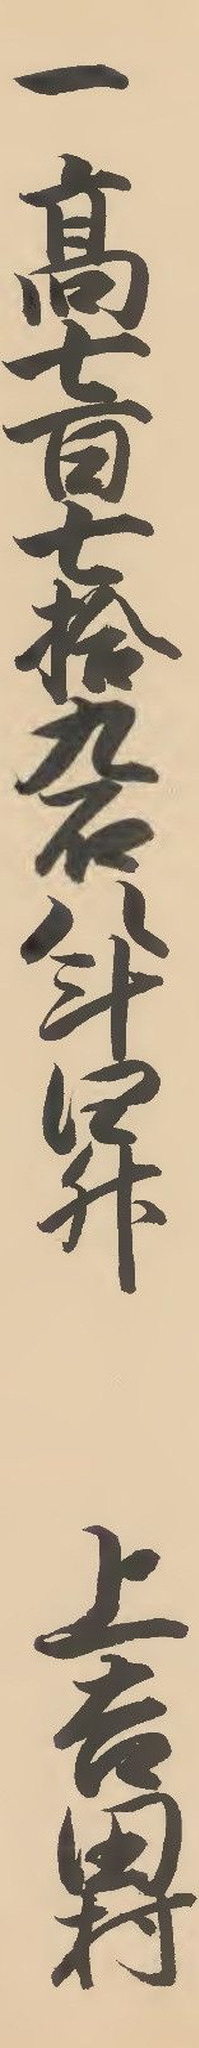一高七百七拾九石八斗四升上吉田村
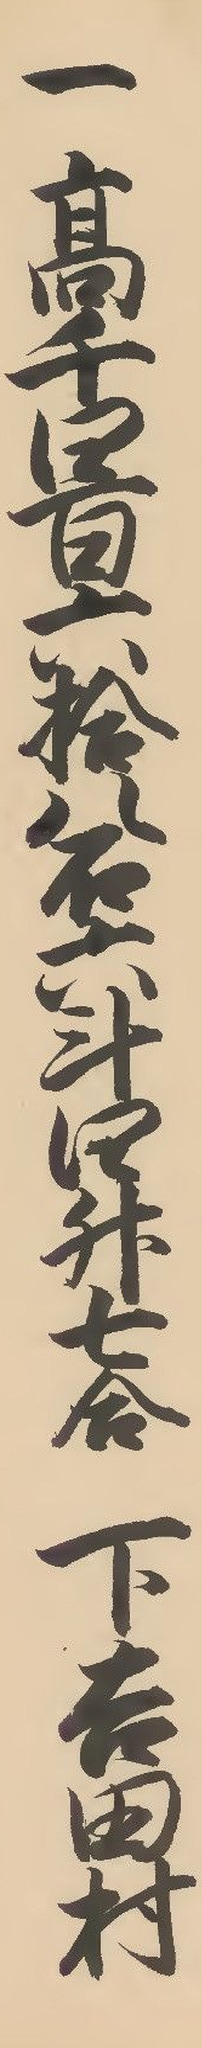一高千四百六拾八石六斗四升七合下吉田村

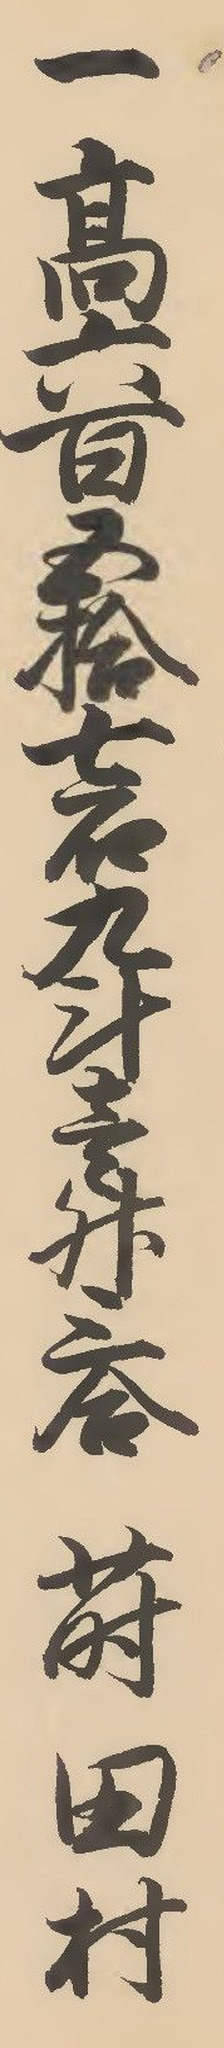一高六百五拾七石九斗壱升三合蒔田村
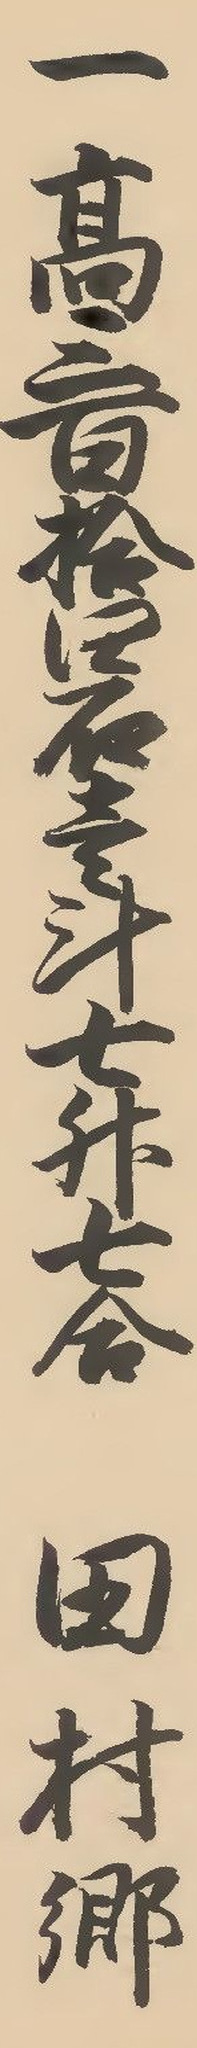一高三百拾四石壱斗七升七合田村郷
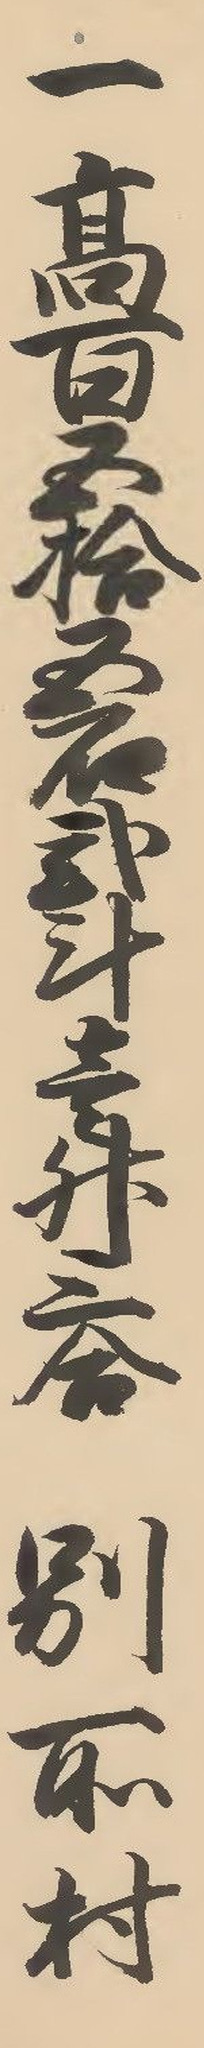一高百五拾五石弐斗壱升三合別所村
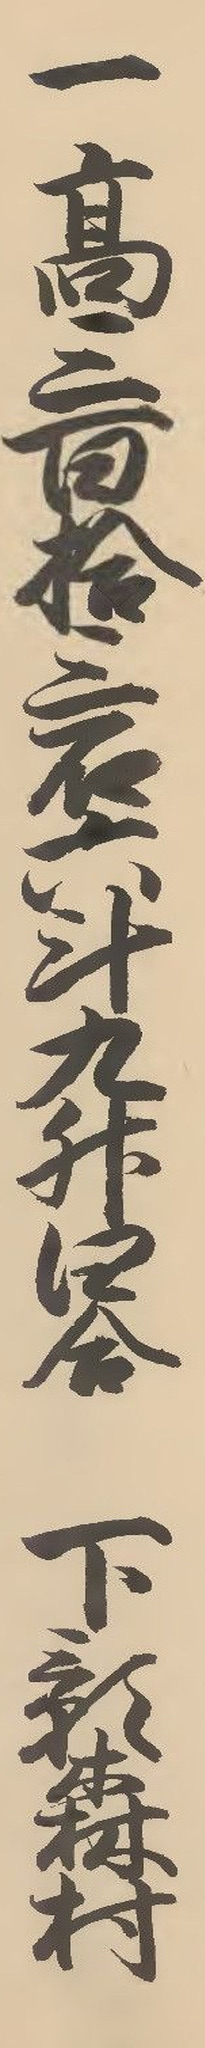一高三百拾三石六斗九升四合下影森村
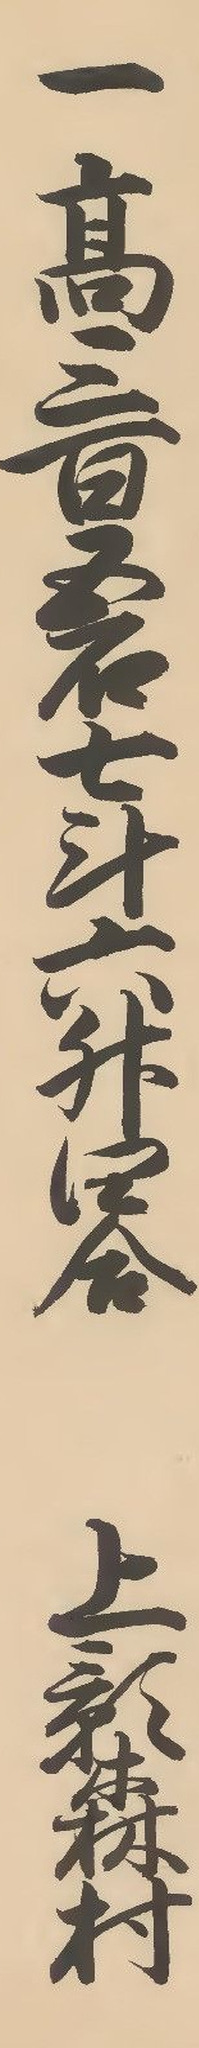一高三百五石七斗六升四合上影森村
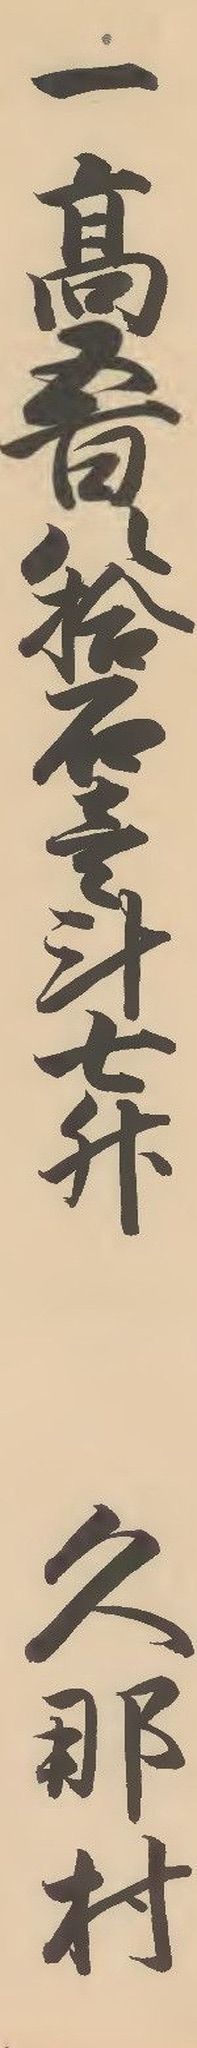一高五百八拾石壱斗七升久那村
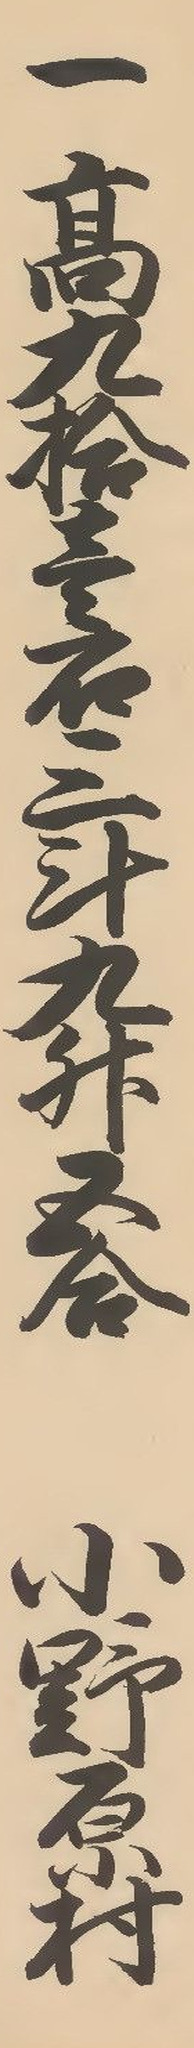一高九拾壱石三斗九升五合小野原村
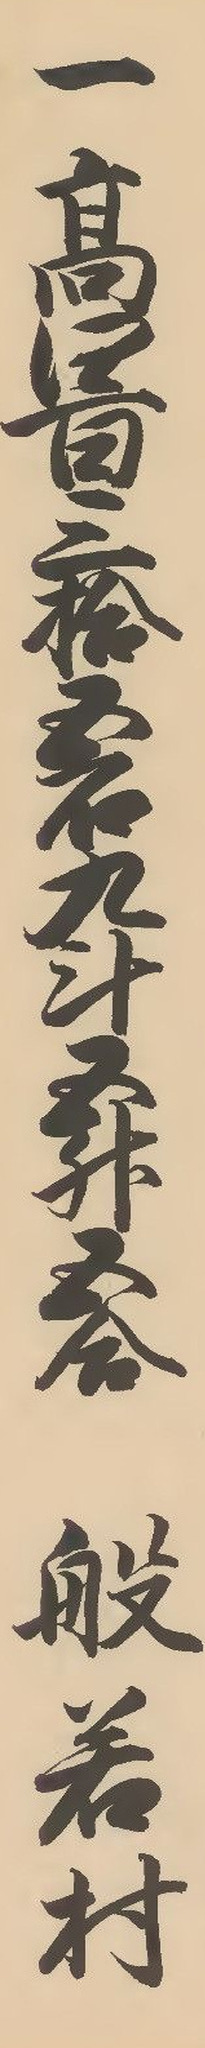一高四百三拾五石九斗五升五合般若村

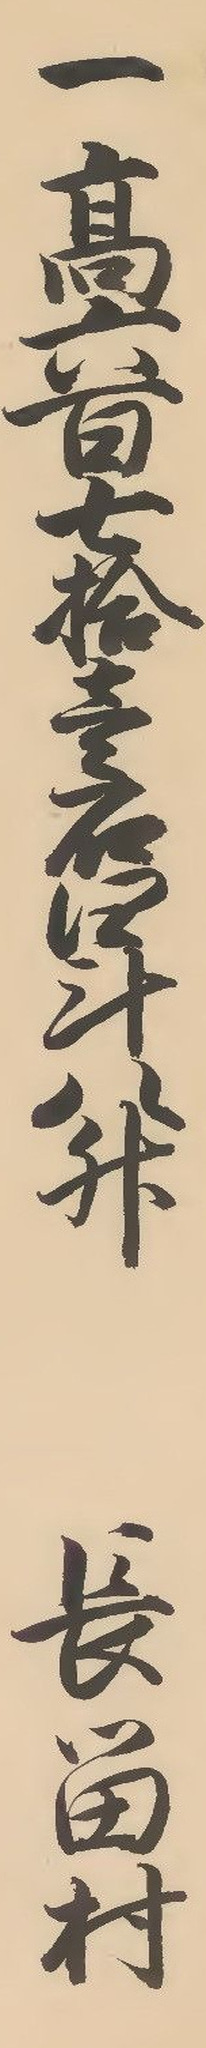一高六百七拾壱石四斗八升長留村
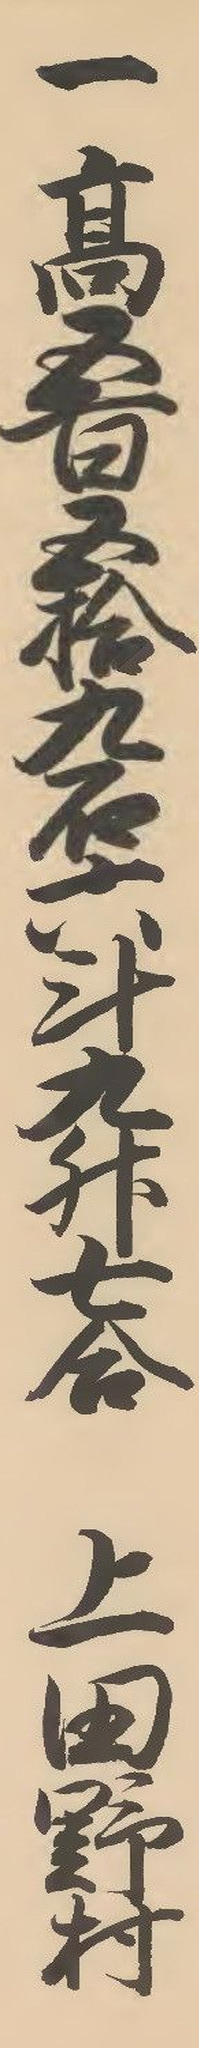一高五百五拾九石六斗九升七合上田野村
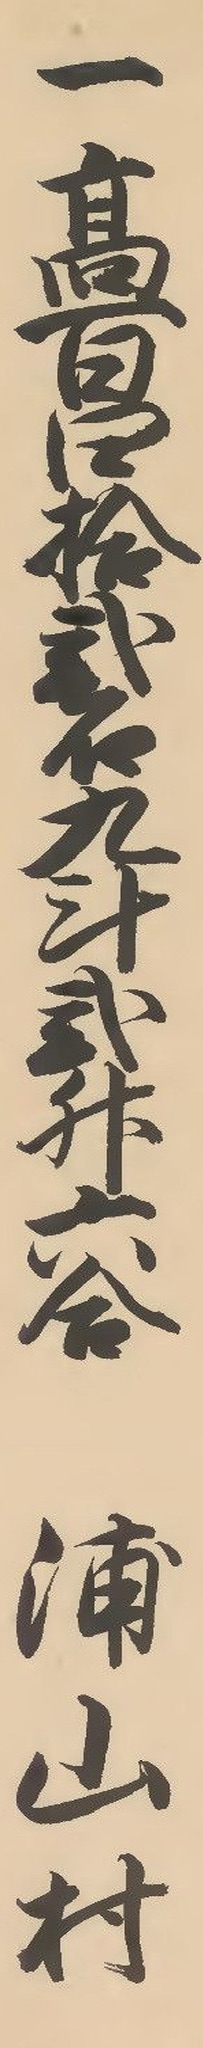一高百四拾弐石九斗弐升六合浦山村
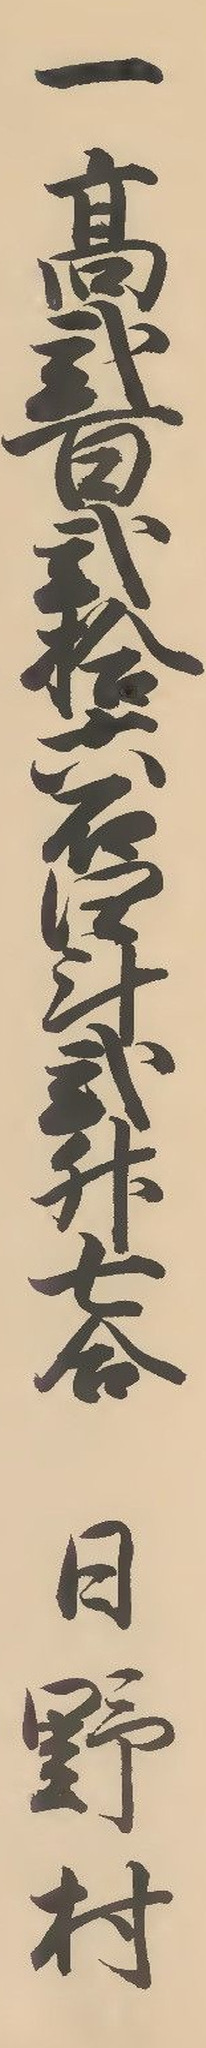一高弐百弐拾六石四斗弐升七合日野村
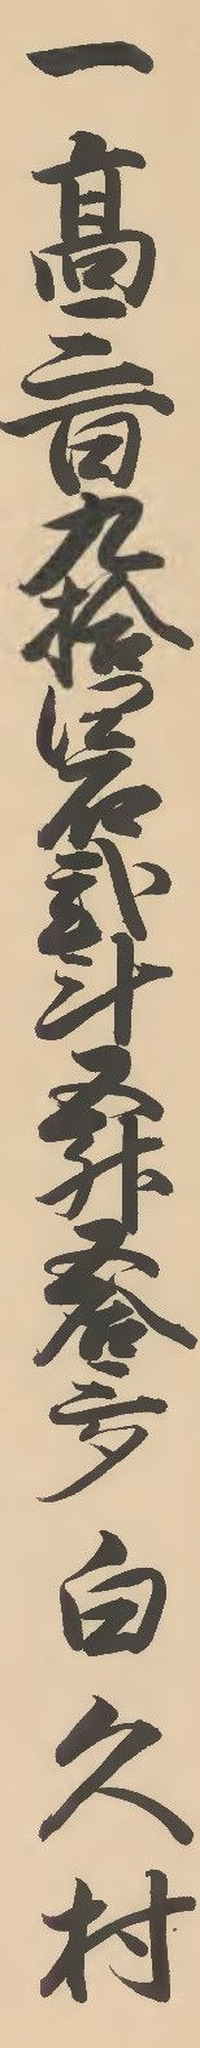一高三百九拾四石弐斗五升五合三勺白久村
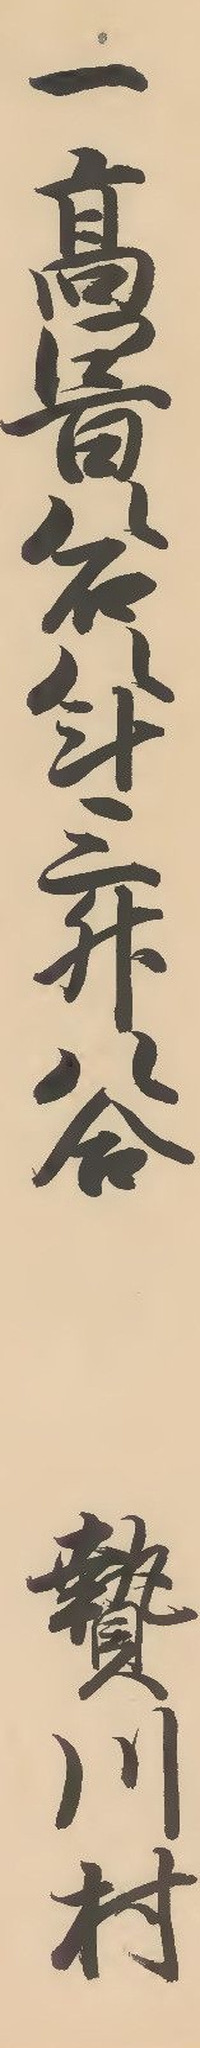一高四百八石八斗三升八合贄川村
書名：武蔵国郷帳　上
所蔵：国立公文書館 National Archives of Japan
